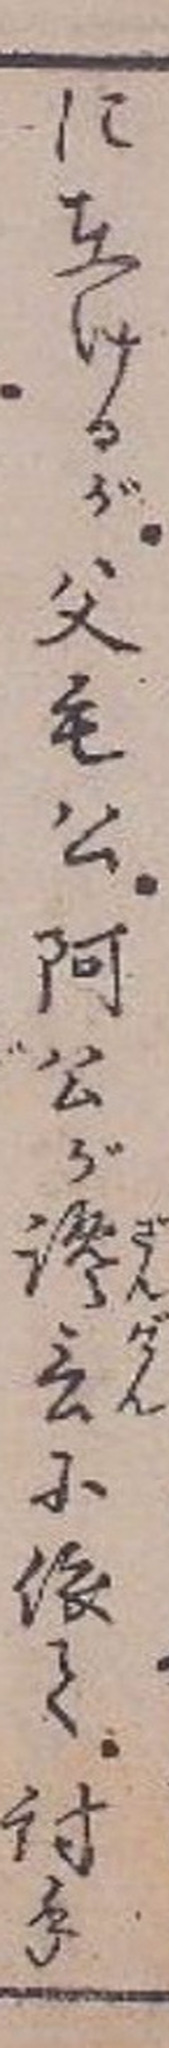に在けるが、父毛公、阿公が讒言に依て、討手
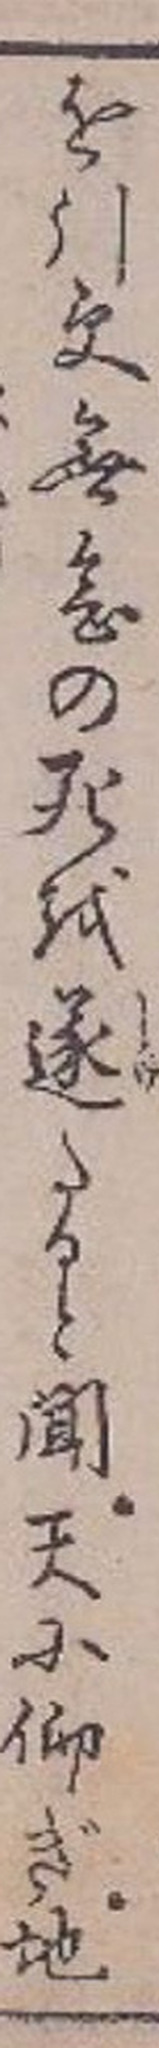を引受、無念の死を遂たると聞、天に仰ぎ、地
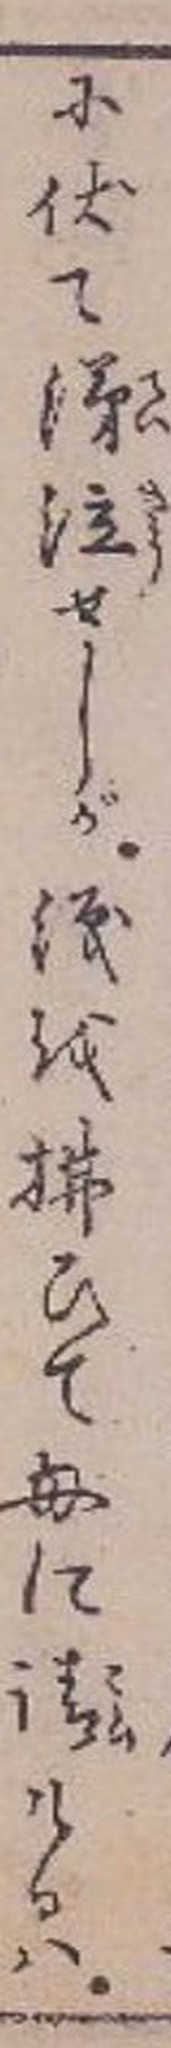に伏て涕泣せしが、涕を払ひて母に請けるは、
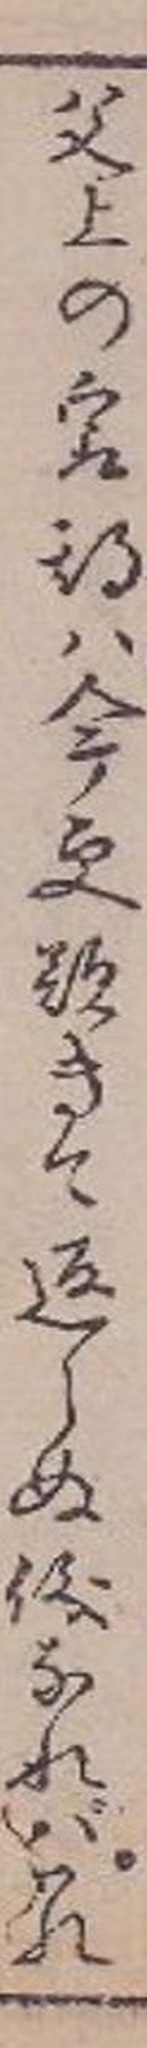父上の最期は、今更歎きて返らぬ儀なれば、われ
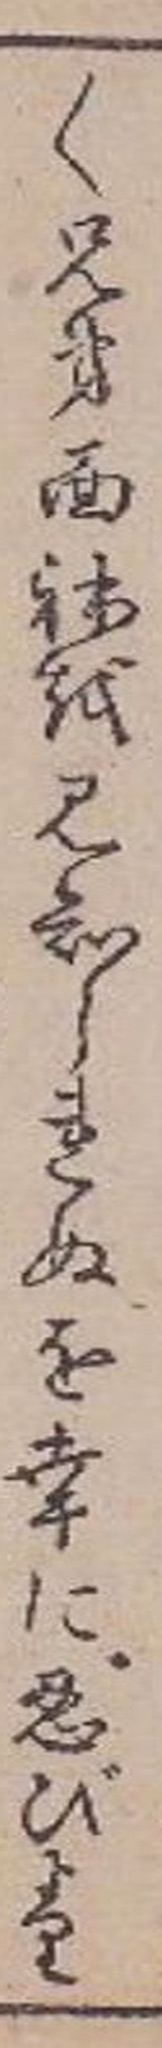〳〵兄弟面体を見知られぬを幸に、忍びより
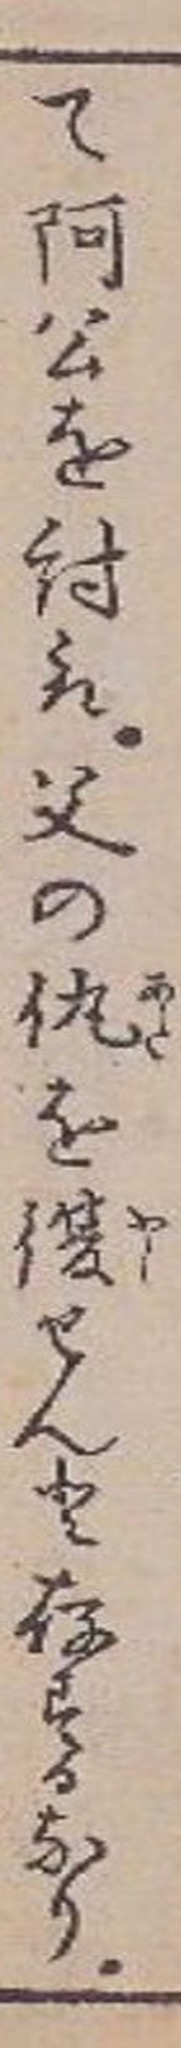て阿公を討取、父の仇を復せんと存するなり、
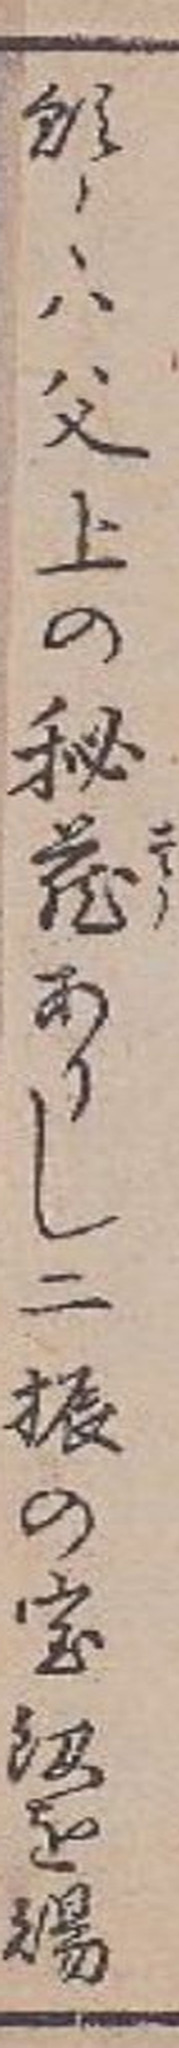願くは父上の秘蔵ありし二振の宝釼を賜
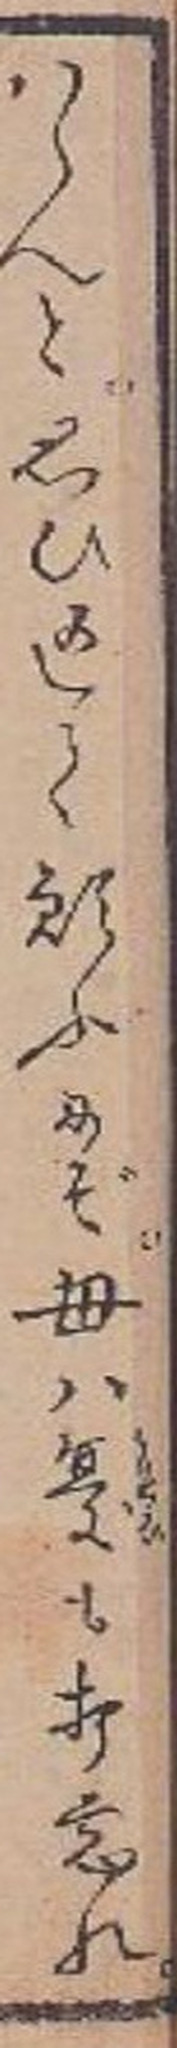はらんと、思ひ込て願ふにぞ、母は憂も打忘れ、
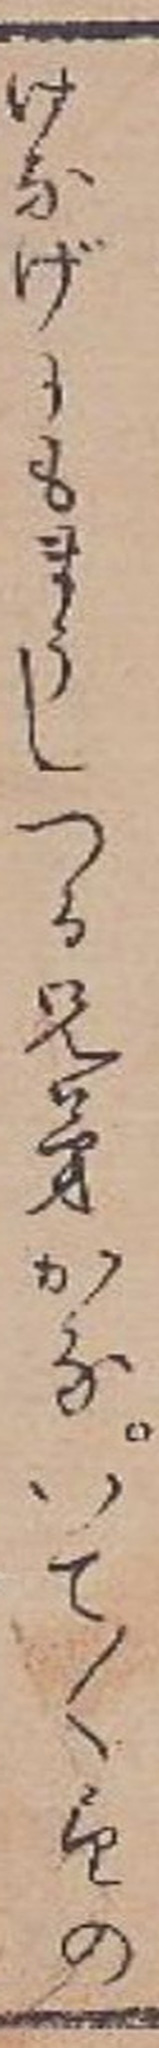けなげにもまうしつる兄弟かな、いて〳〵望の
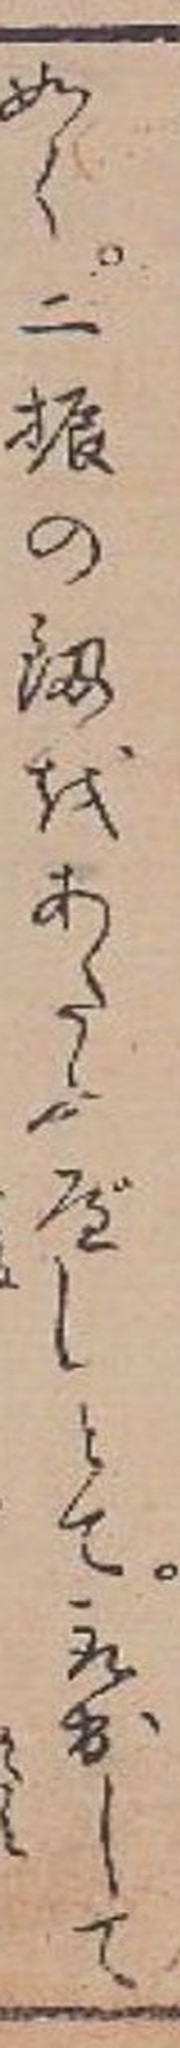如く、二振の釼をあたふべしとて、取出して
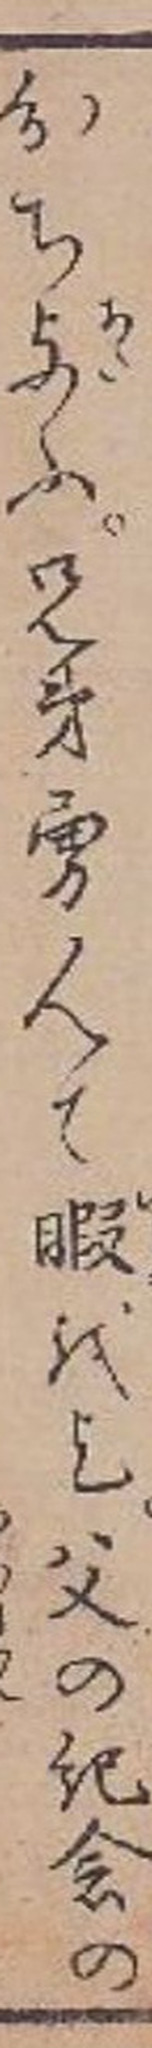分ち与ふ、兄弟勇んて暇を乞、父の紀念の
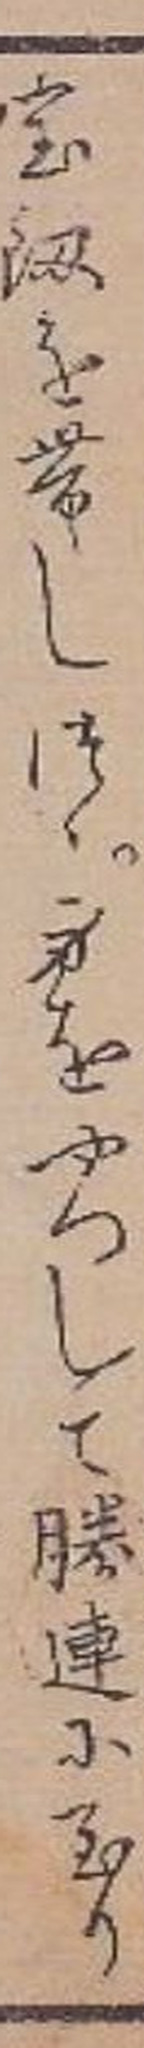宝釼を帯しつゝ、身をやつして勝連に至り、
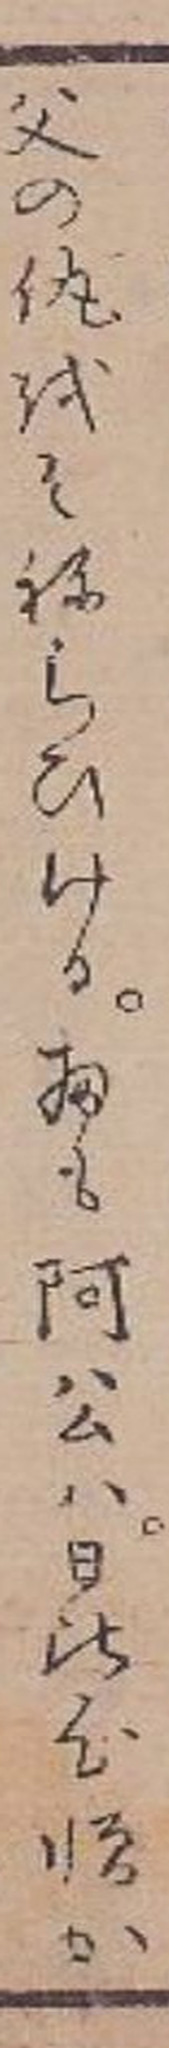父の仇をそねらひける、扨も阿公は、日頃心憎か
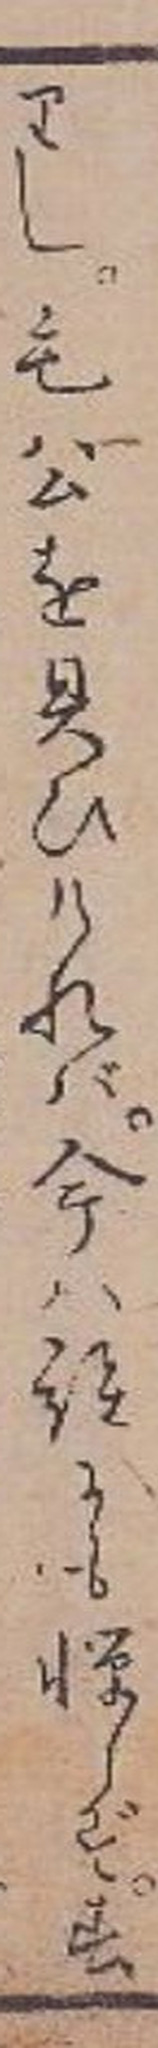りし、毛公を具ひければ、今は程にも憚らず、春
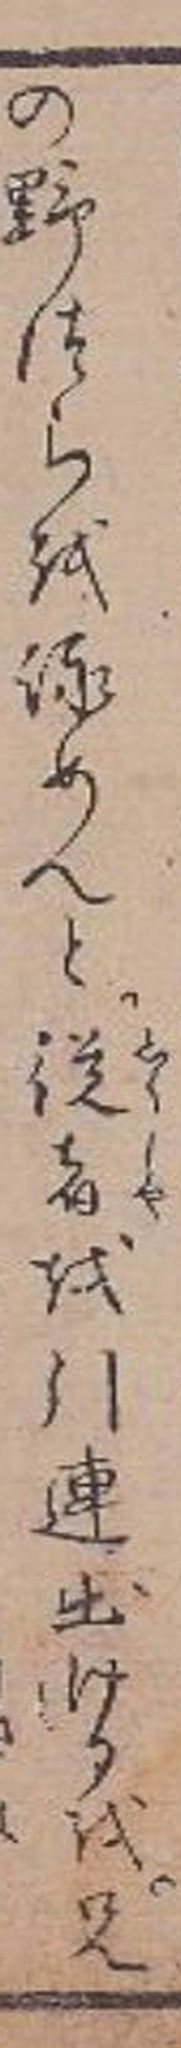の野つらを詠めんと、従者を引連出けるを、兄
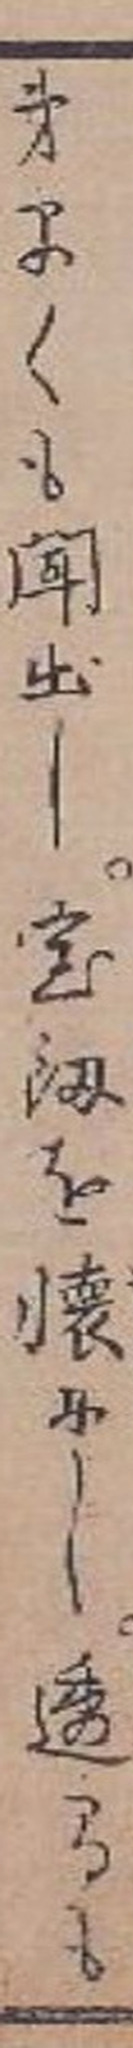弟早くも聞出し、宝釼を懐にし、透間も
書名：琉球談
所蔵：University of the Ryukyus Library
